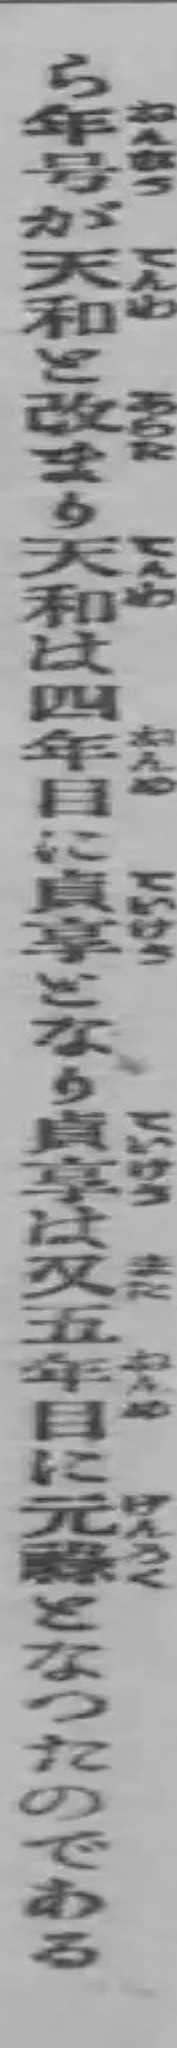ら年号が天和と改まり天和は四年目に貞享となり貞享は又五年目に元禄となつたのである
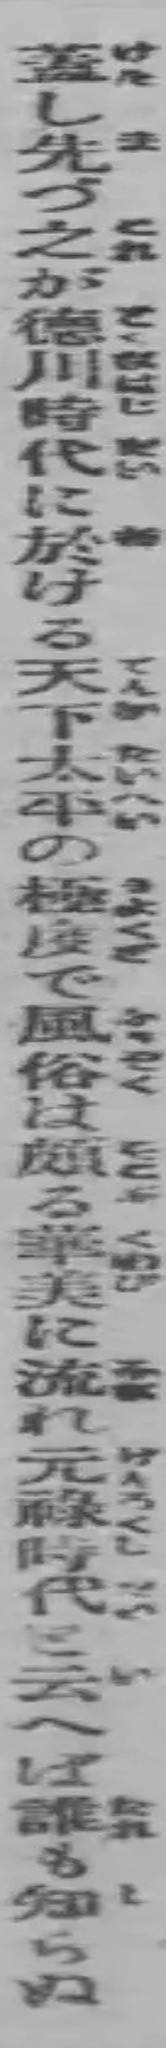元禄時代蓋し先づ之が徳川時代に於ける天下太平の極度で風俗は頗る華美に流れ元禄時代と云へば誰も知らぬ
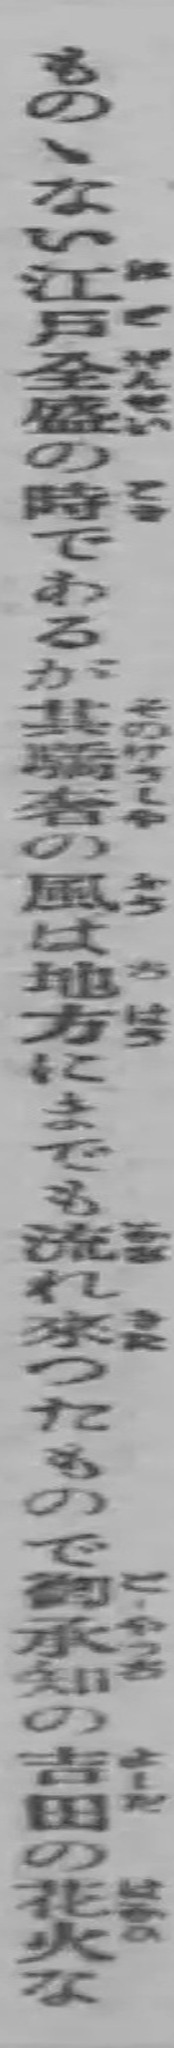吉田の花火ものゝない江戸全盛の時であるが其驕奢の風は地方までも流れ来つたもので御承知の吉田の花火な
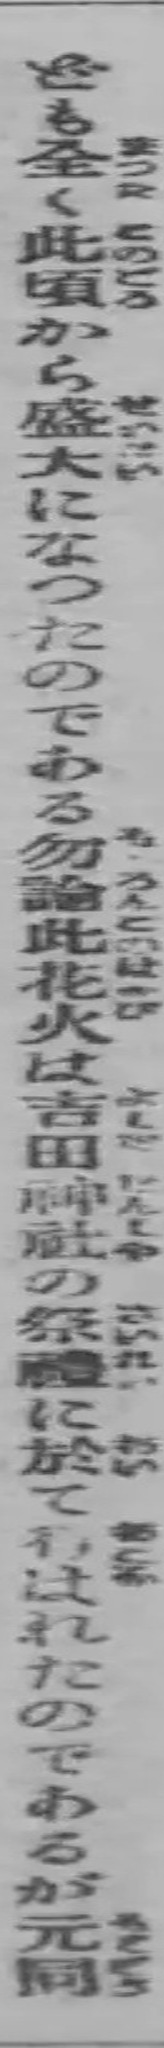ども全く此頃から盛大になつたのである勿論此花火は吉田神社の祭礼に於て行はれたのであるが元同
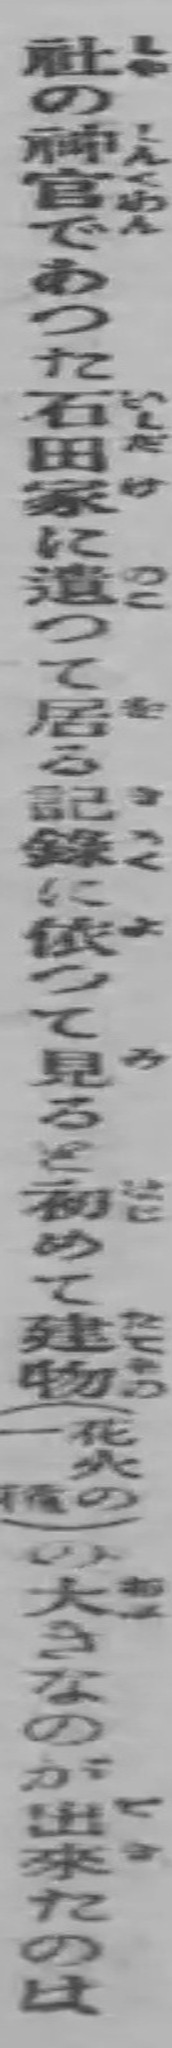社の神官であつた石田家に遺つて居る記録に依つて見ると初めて建物(花火の一種)の大きなのが出来たのは
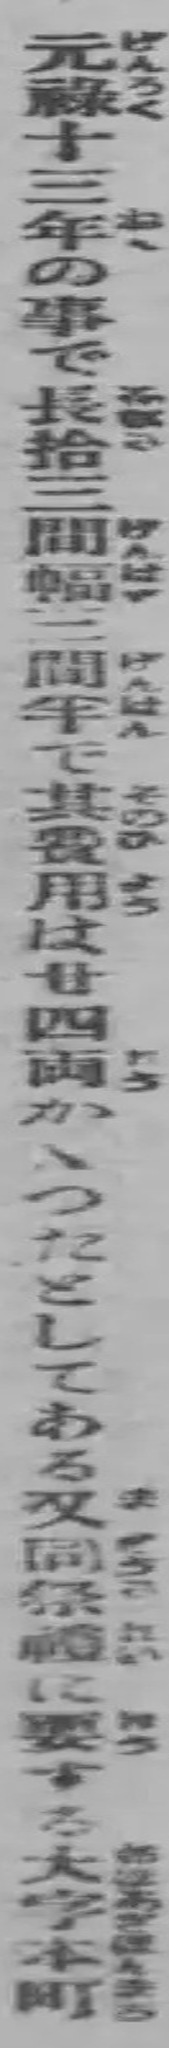元禄十三年の事で長拾三間幅三間半で其費用は廿四両かゝつたとしてある又同祭礼に要する大字本町
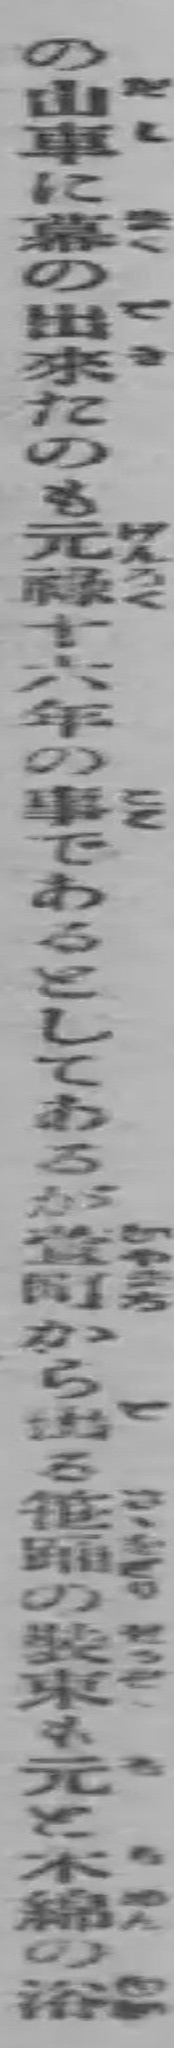笹踊の装束の山車に幕の出来たのも元禄十六年の事であるとしてあるが萱町から出る笹踊の装束も元と木綿の浴

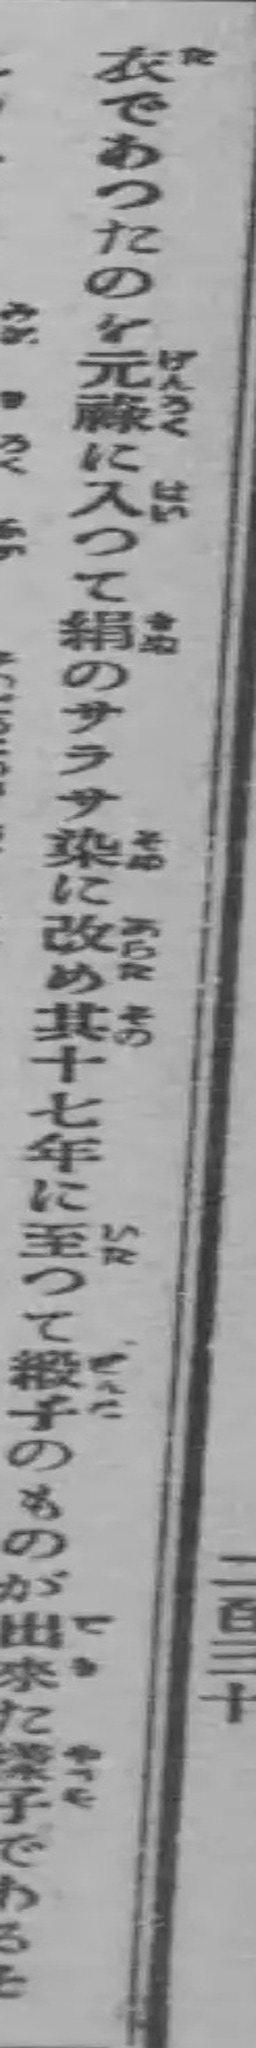衣であつたのを元禄に入つて絹のサラサ染に改め其十七年に至つて緞子のものが出来た様子であるそ
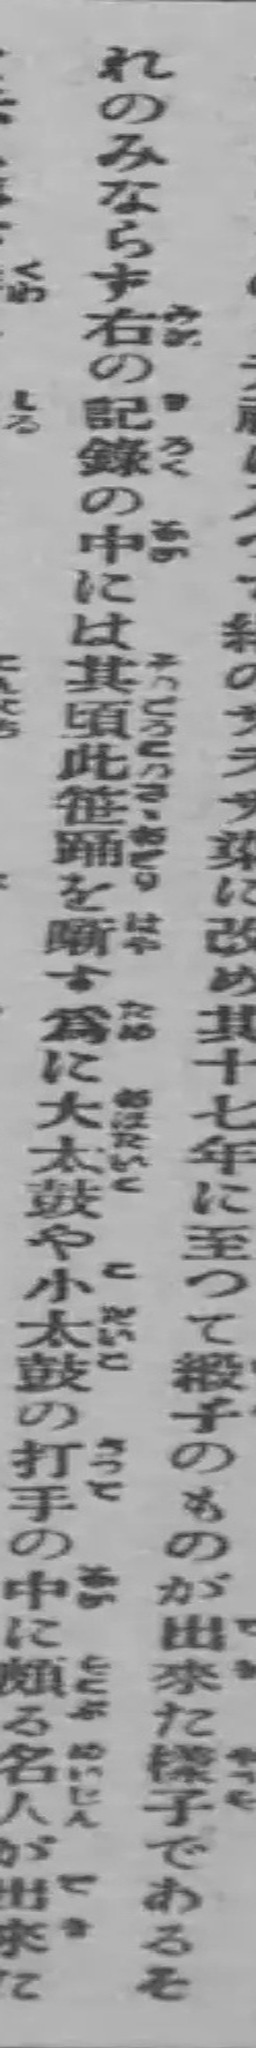れのみならず右の記録の中には其頃此笹踊を噺す為に大太鼓や小太鼓の打手の中に頗る名人が出来た
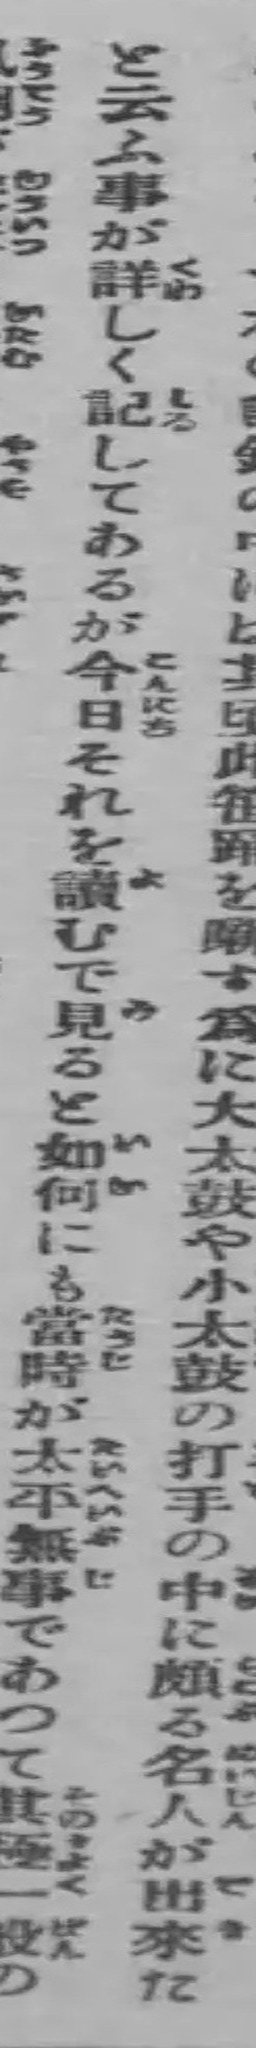と云ふ事が詳しく記してあるが今日それを読むで見ると如何にも当時が太平無事であつて其極一般の
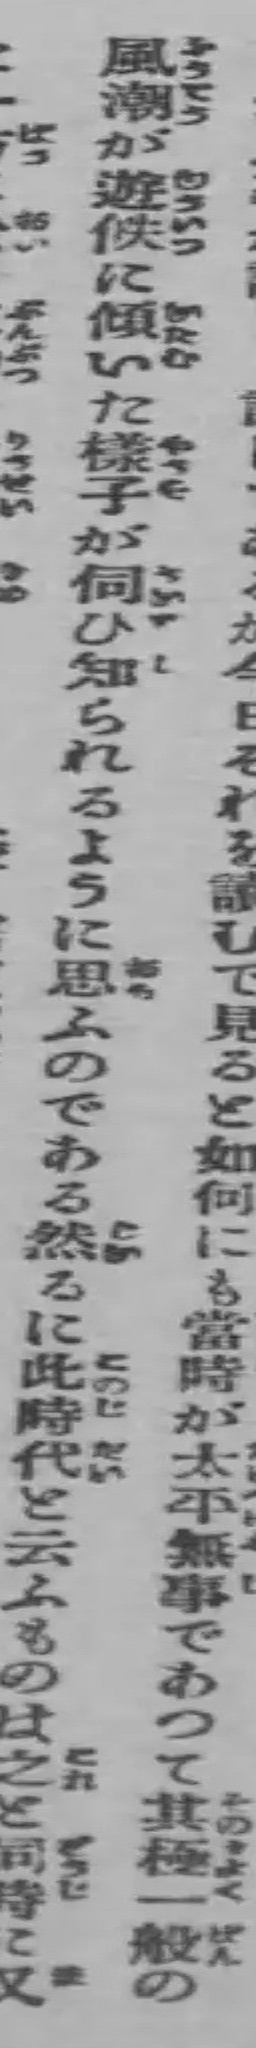風潮が遊佚に傾いた様子が伺ひ知られるように思ふのである然るに此時代と云ふものは之と同時に又
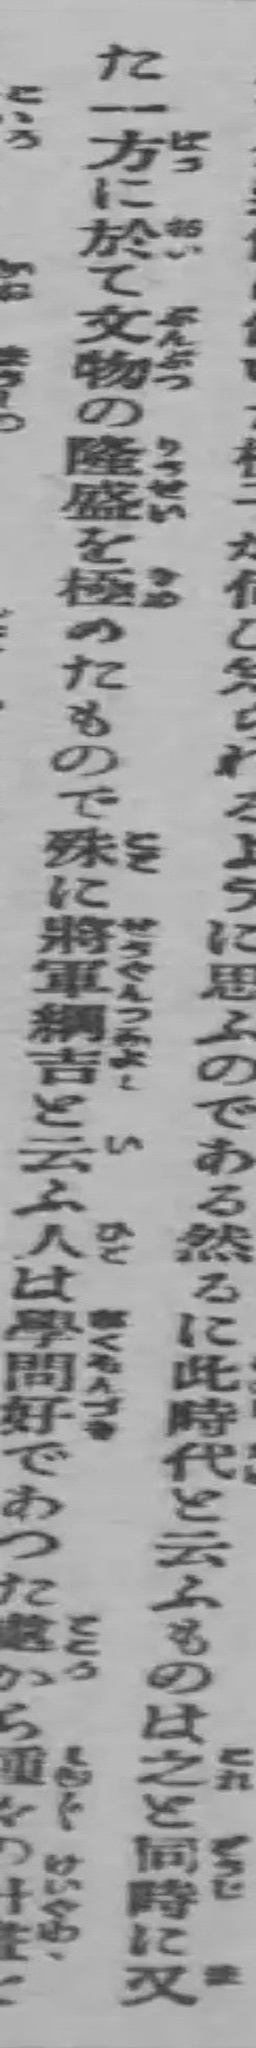た一方に於て文物の隆盛を極めたもので殊に将軍綱吉と云ふ人は学問好であつた処から種々の計画を
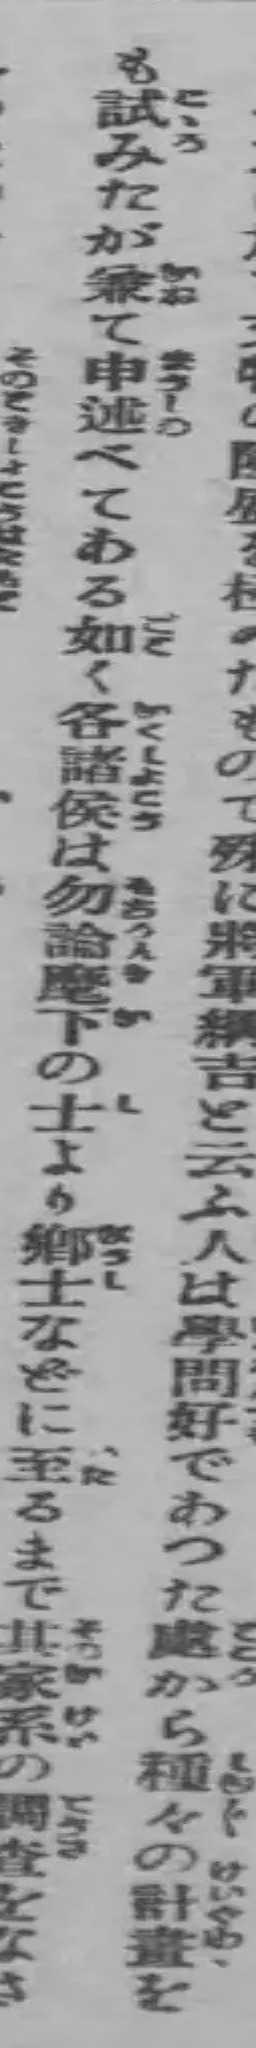貞享書上も試みたが兼て申述べてある如く各諸侯は勿論麾下の士より郷士などに至るまで其家系の調査をなさ
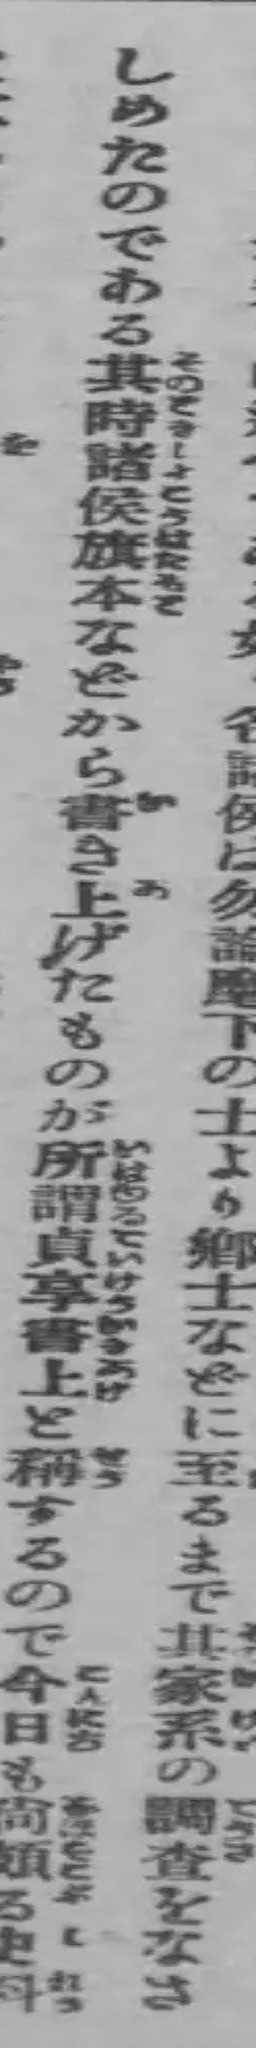しめたのである其時諸侯旗本などから書き上げたものが所謂貞享書上と称するので今日も尚頗る史料
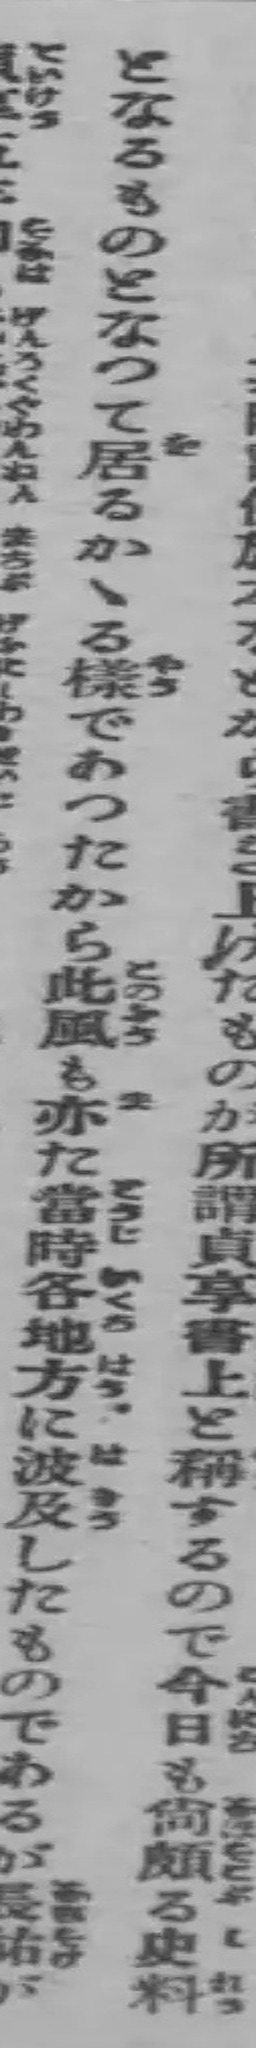となるものとなつて居るかゝる様であつたから此風も亦た当時各地方に波及したものであるが長祐が
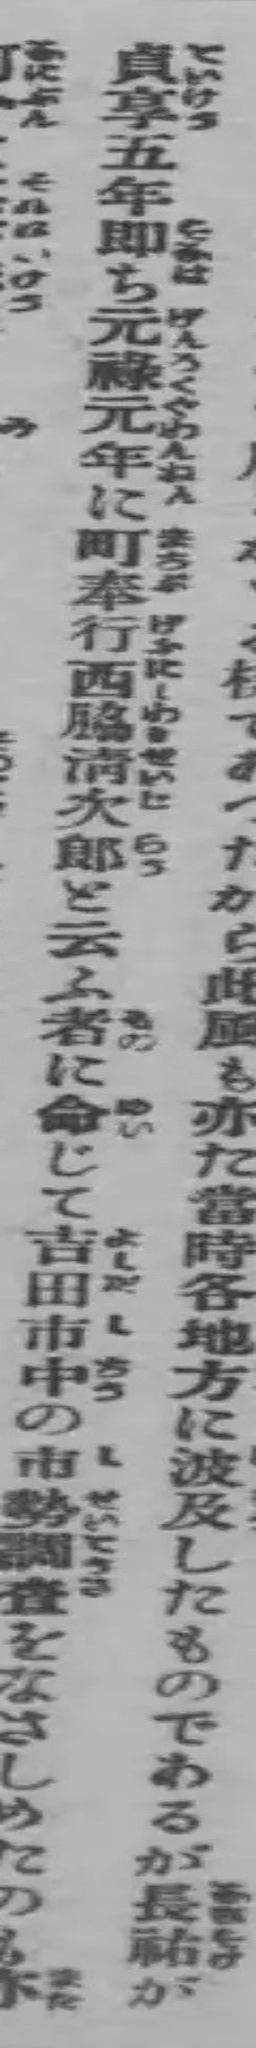市勢調査貞享五年即ち元禄元年に町奉行西脇清次郎と云ふ者に命じて吉田市中の市勢調査をなさしめたのも亦
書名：豊橋市史談
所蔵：国立国会図書館 National Diet Library, JAPAN
